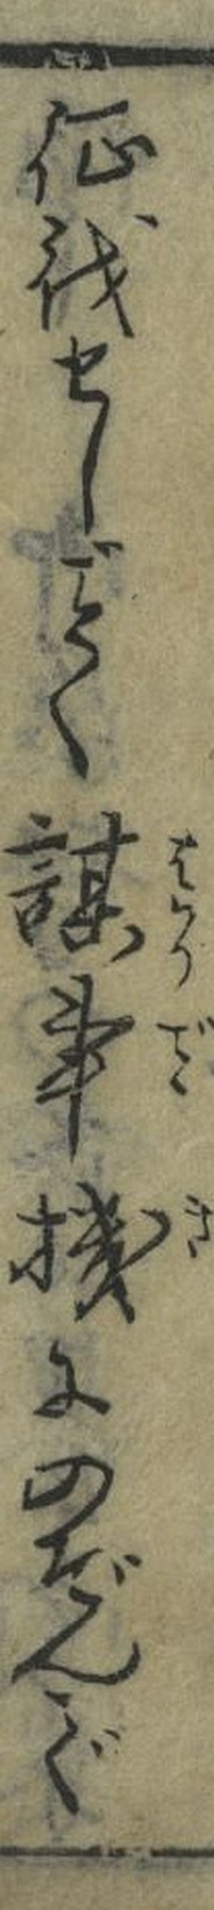征伐せしごとく謀事機にのぞんで
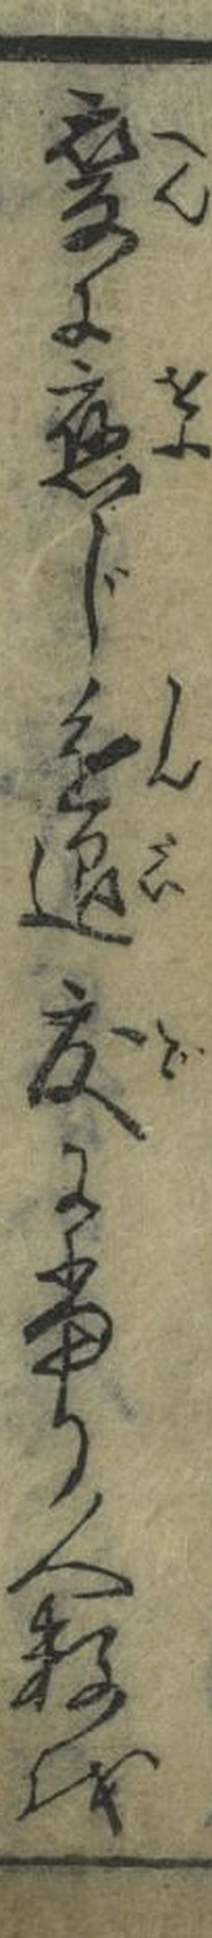変に応じ進退度に当り人数を
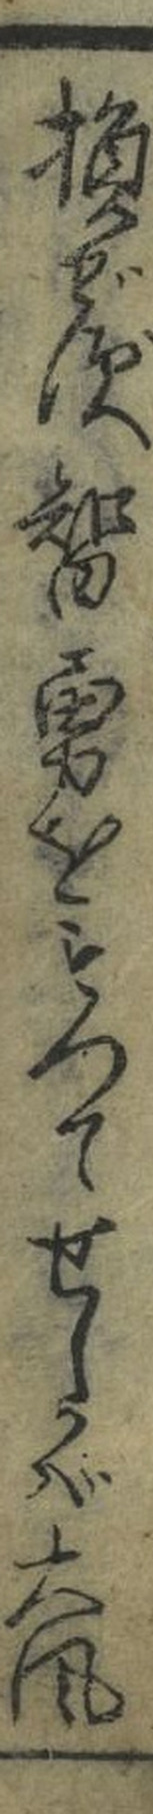損ぜず智勇をもつてせしかば六風

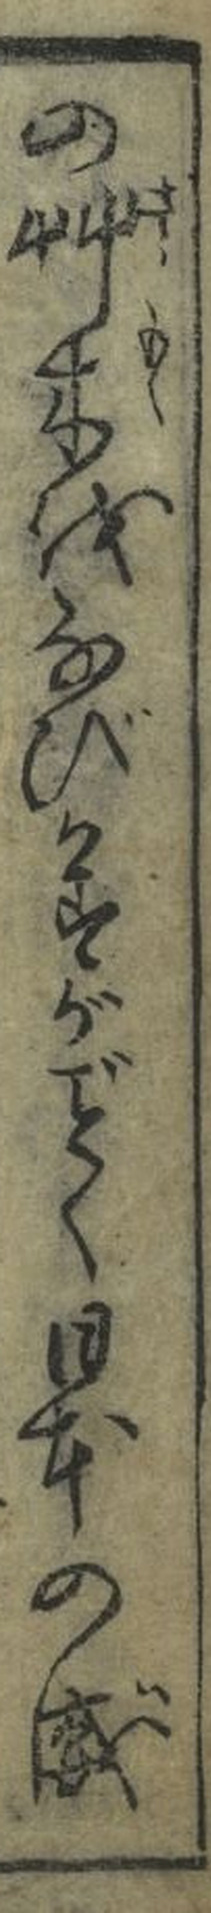の草木をなびかすがごとく日本の威
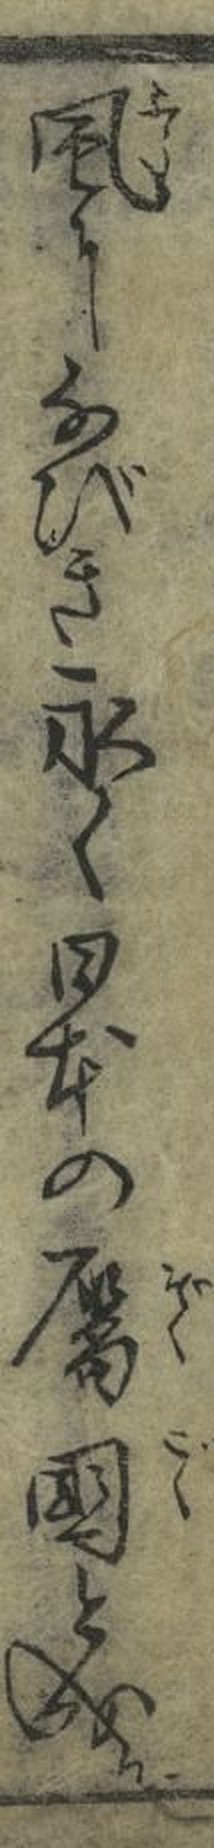風になびき永く日本の属国と成り
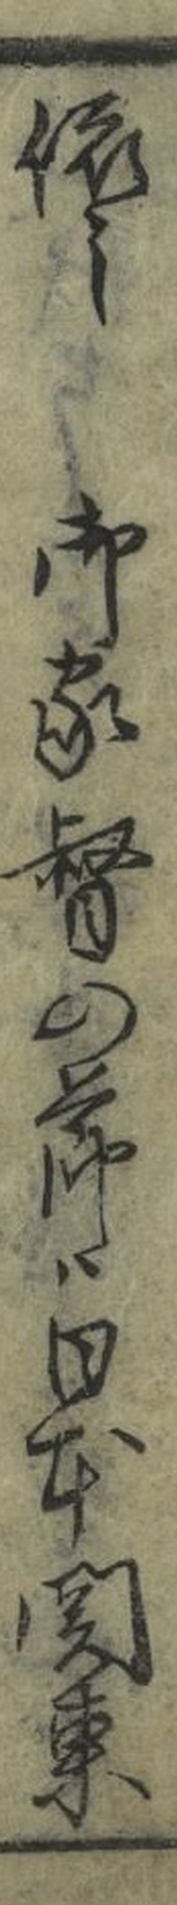依し御家督の節は日本関東
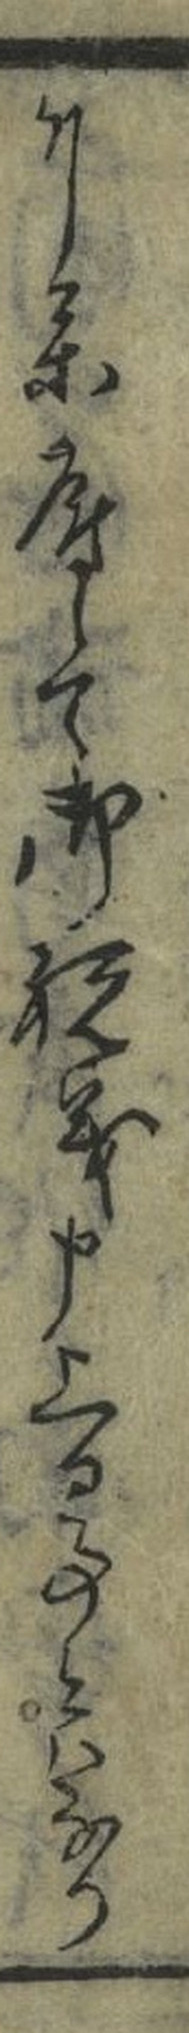に参府して御祝義申上る事とはなり
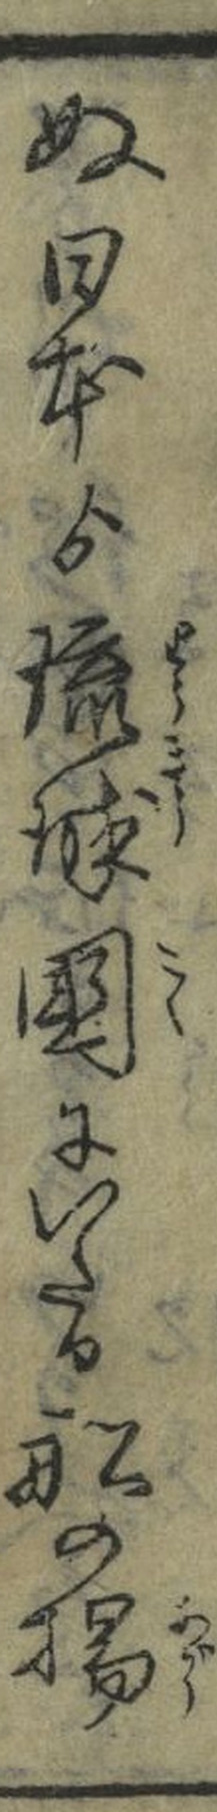ぬ日本ゟ琉球国にいたる船の揚
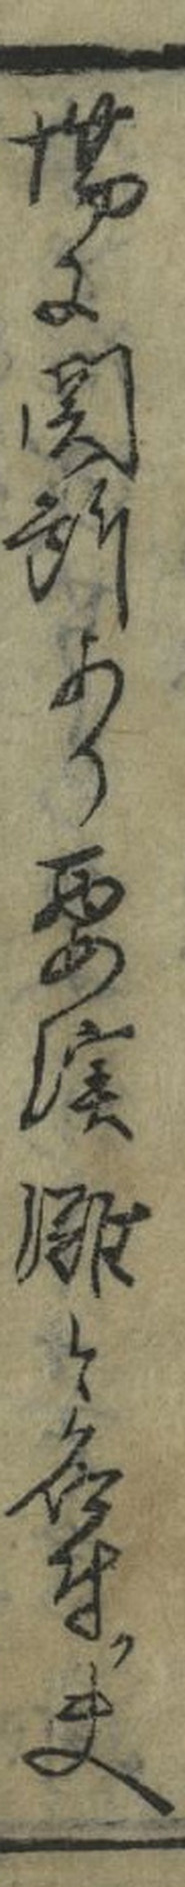場に関所あり要渓灘と名付く夫
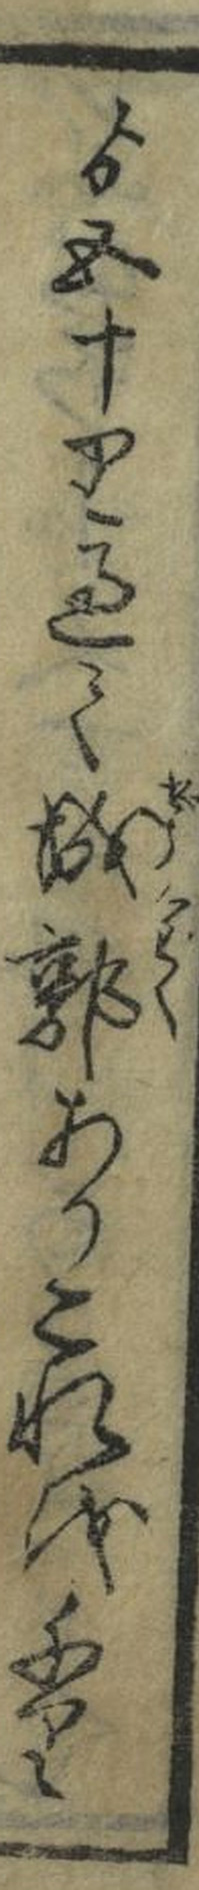ゟ五十里へて城郭ありこれを千里
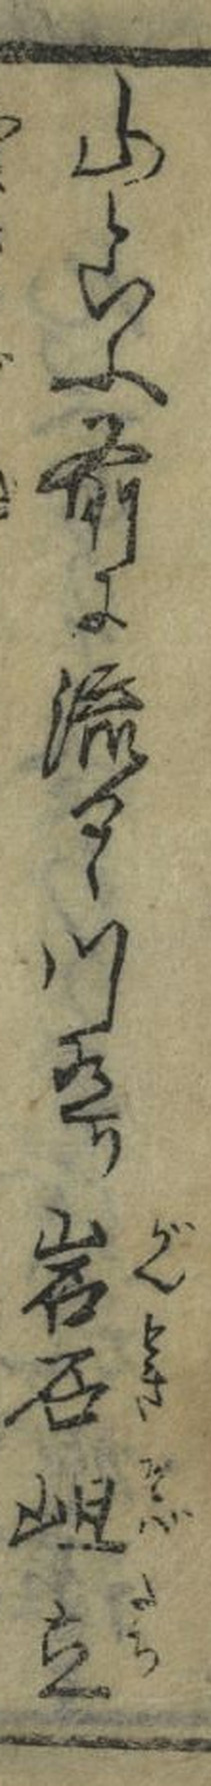山といふ前に流るゝ川有り岩石岨立
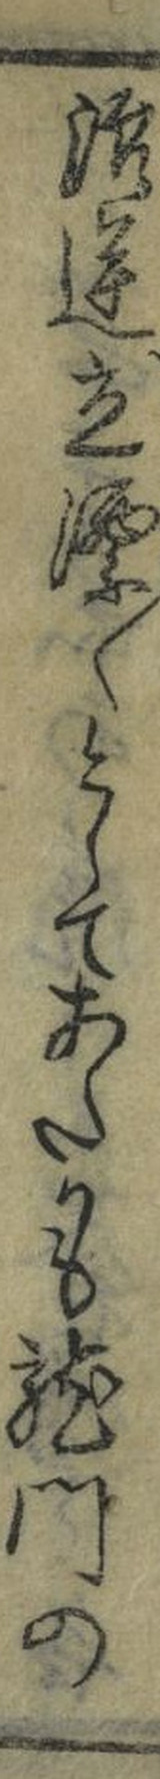洪逆立漂〳〵としてあたかも龍門の
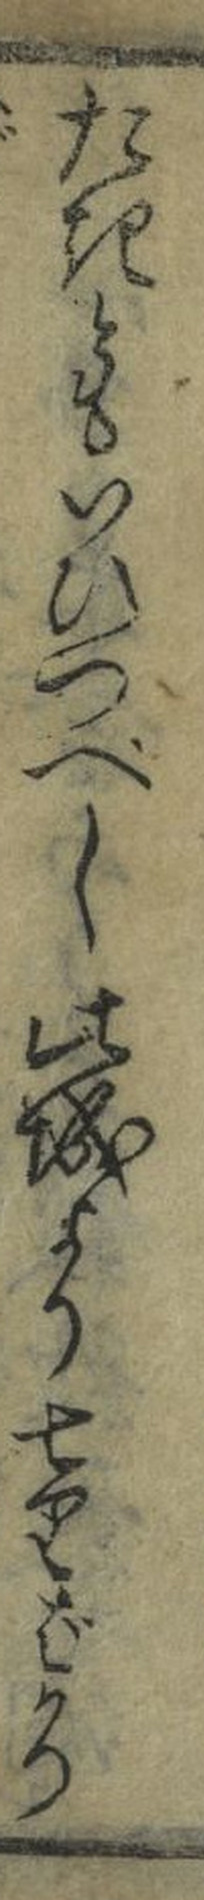たきともいひつべし此城より七里ばかり
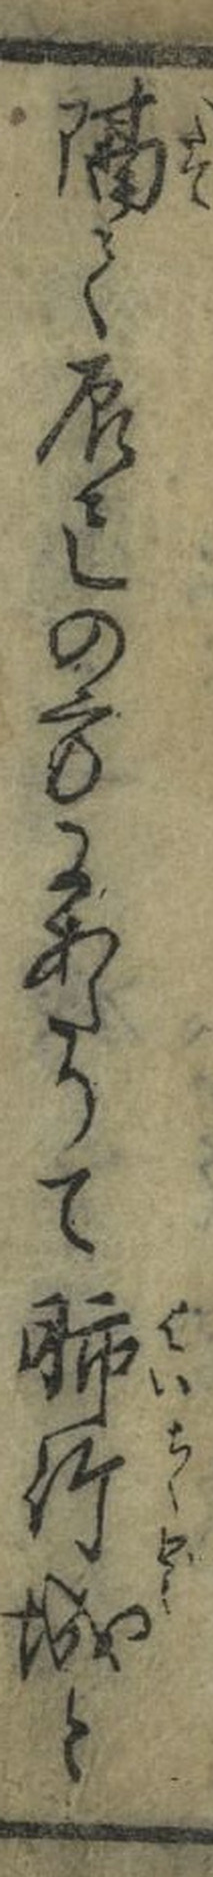隔て辰巳の方にあたりて肺竹城と
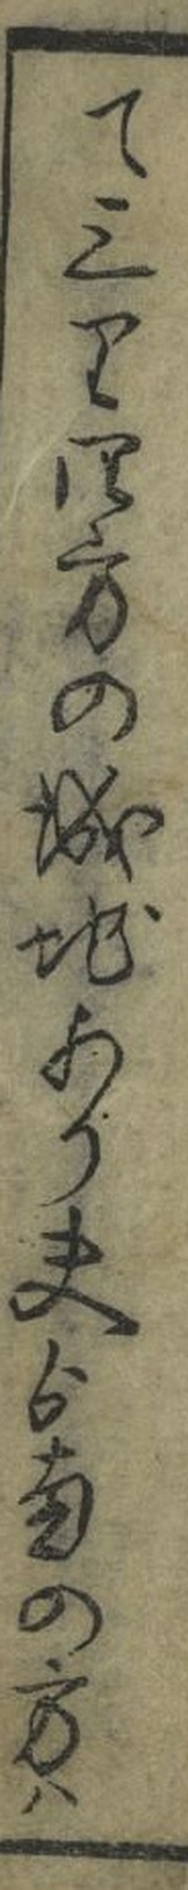て三里四方の城地あり夫ゟ南の方は

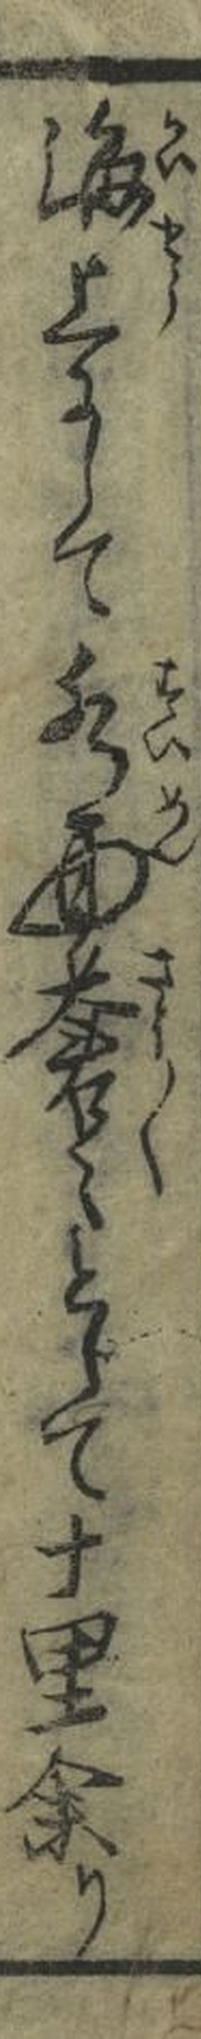海上にして水面蒼々として十里余り
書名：琉球雑話
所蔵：University of the Ryukyus Library
